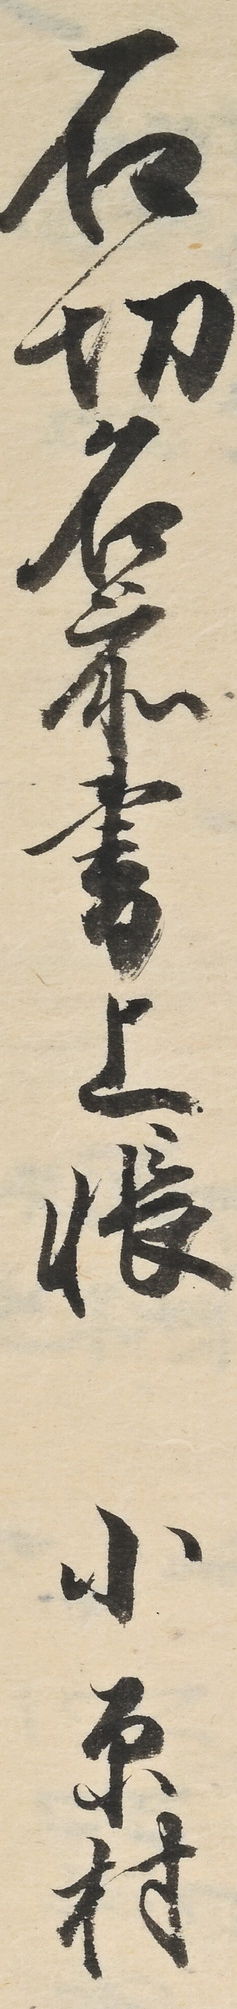石切名前書上帳小原村

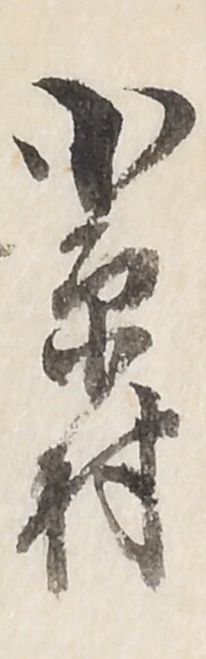小原村
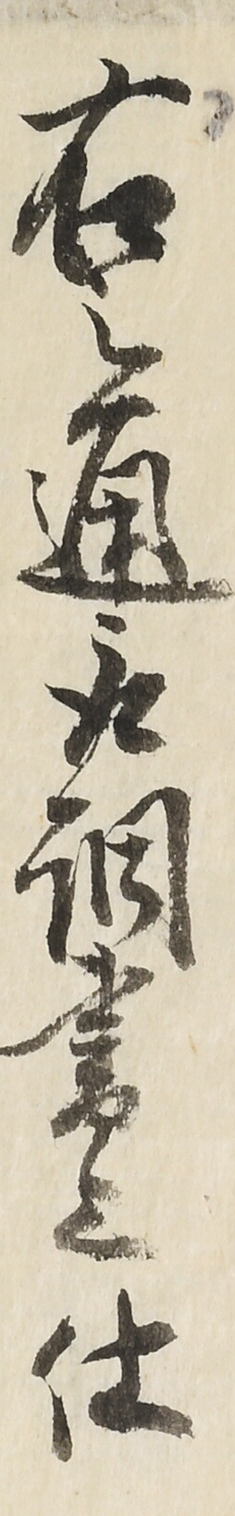右之通取調書上仕
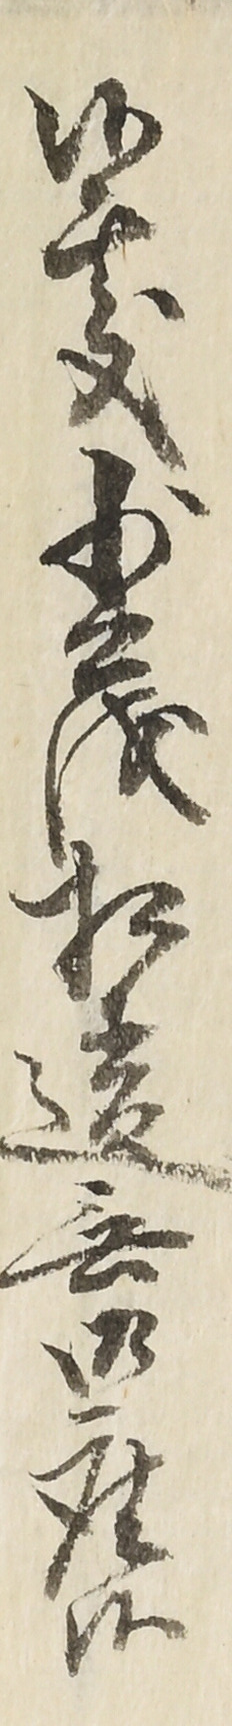候処少も相違無御座候

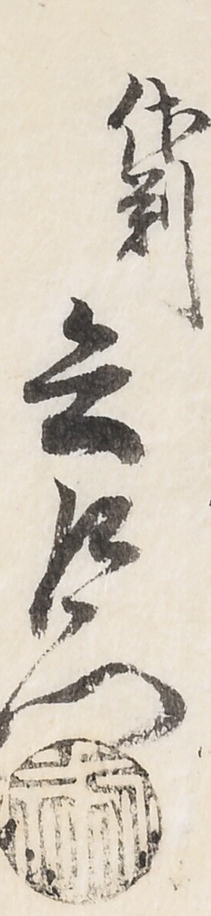代判兵左衛門
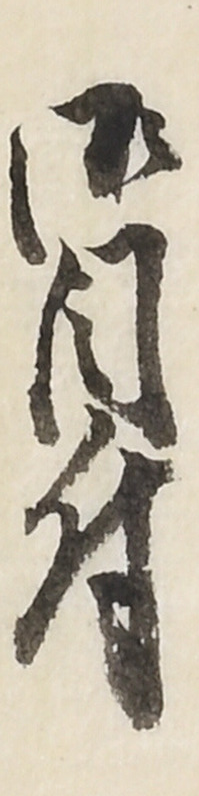御目付
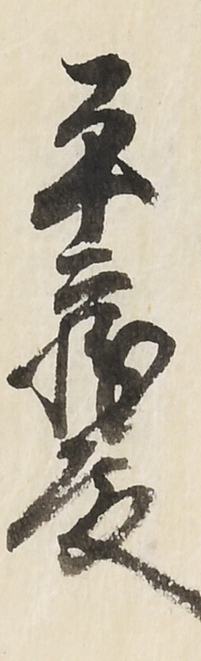平蔵殿
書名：萬延二辛酉年二月石切名前書上帳
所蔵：伊那市立高遠町図書館・合同会社AMANE
